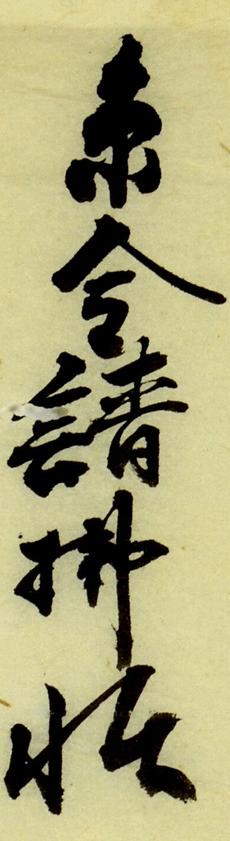糸金請払帳
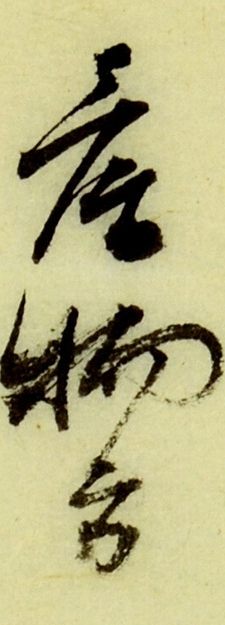産物方
